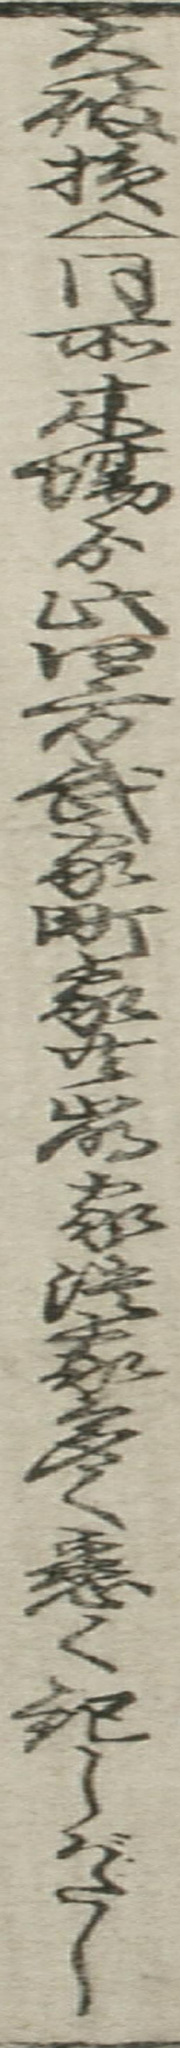大破損△同所木場ゟ此四方武家町家共崩家潰家多く悉く記しがたし
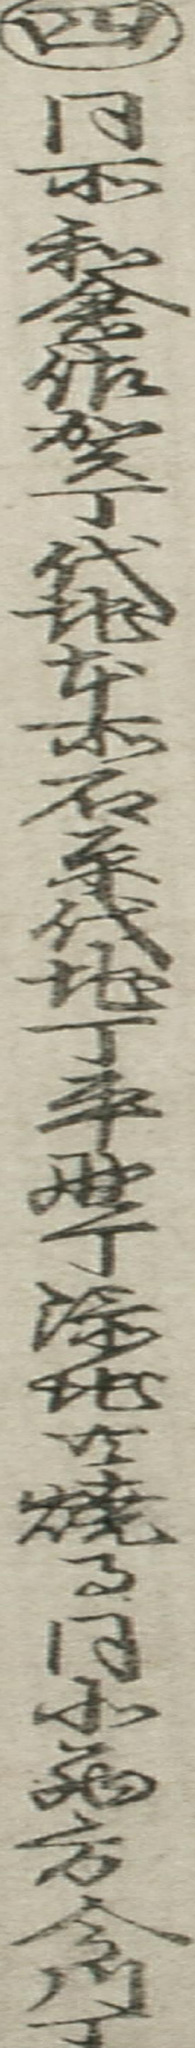同所和倉佐賀丁代地本所石原代地丁平野丁添地共焼る同北西方今川丁
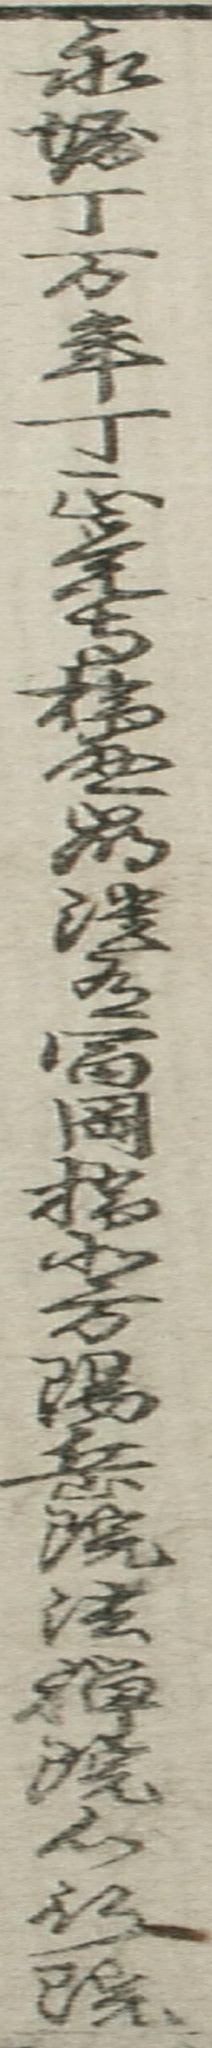永堀丁万年丁正覚寺橋通崩潰有冨岡橋北方陽岳院法禅院心行院
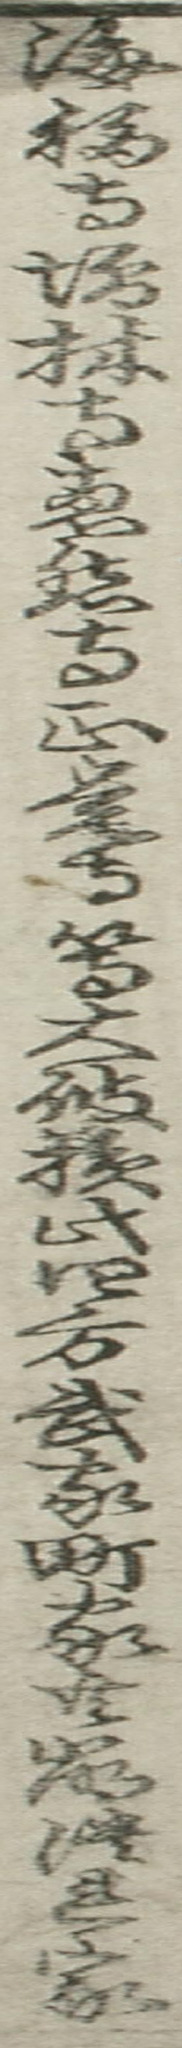海福寺増林寺恵然寺正覚寺等大破損此四方武家町家共崩潰れ家
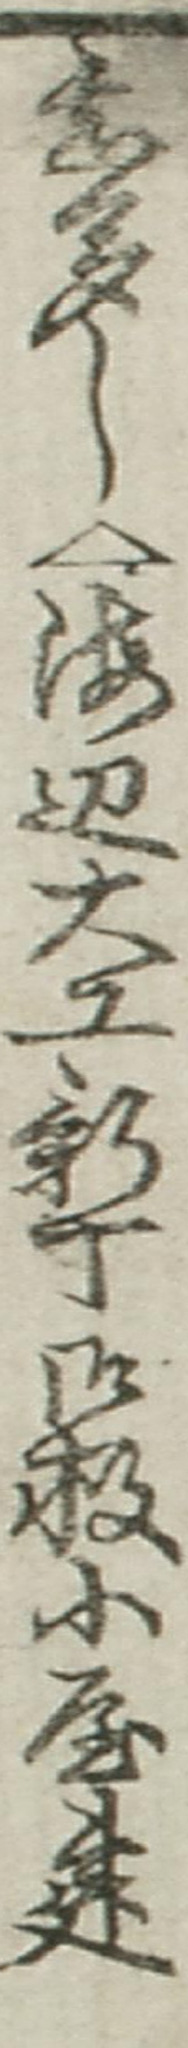甚多し△海辺大工新丁御救小屋建
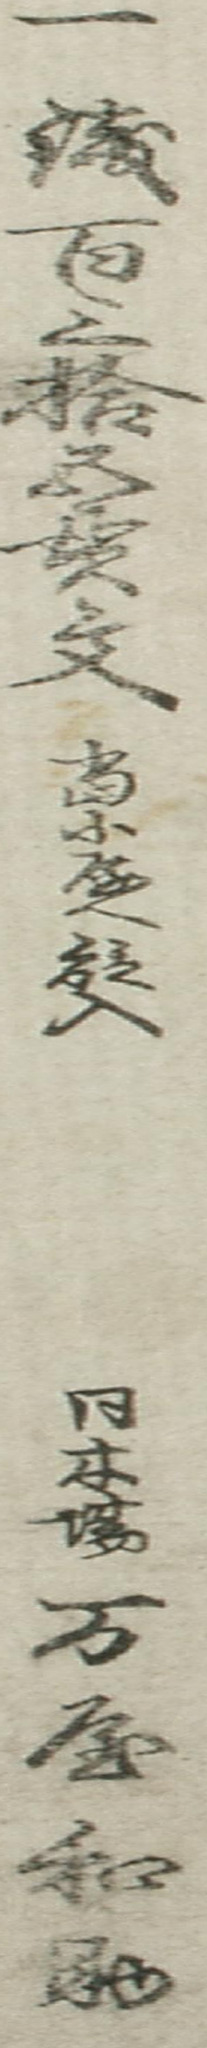一銭百三拾五貫文尚小屋へ施入同木場万屋和助
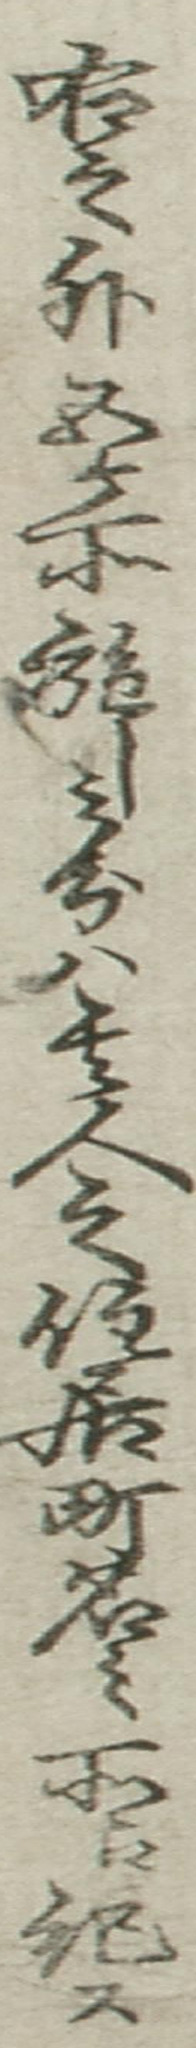右之外五ヶ所施し之分は其人之住居町名之所え記ス

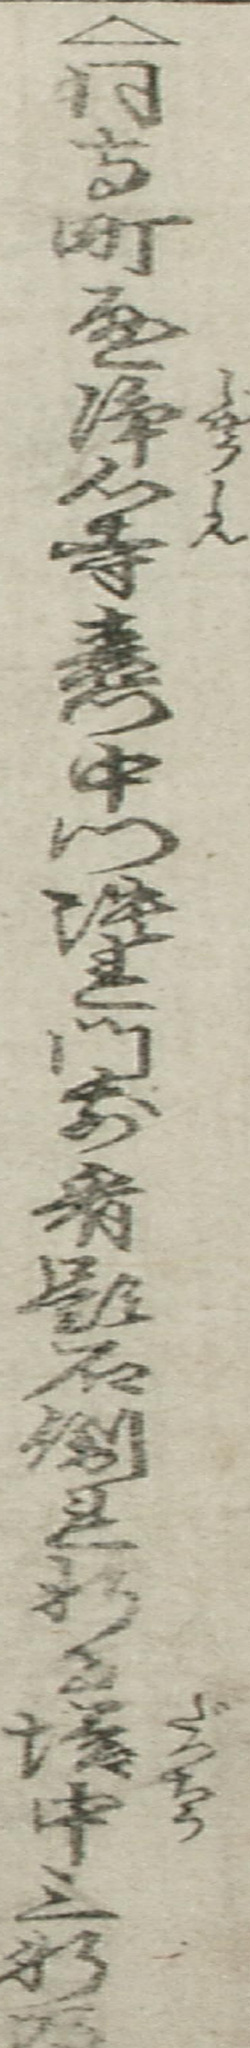△同寺町通浄心寺表門中門潰れ門前看題石倒れ折る塔中三軒及手水
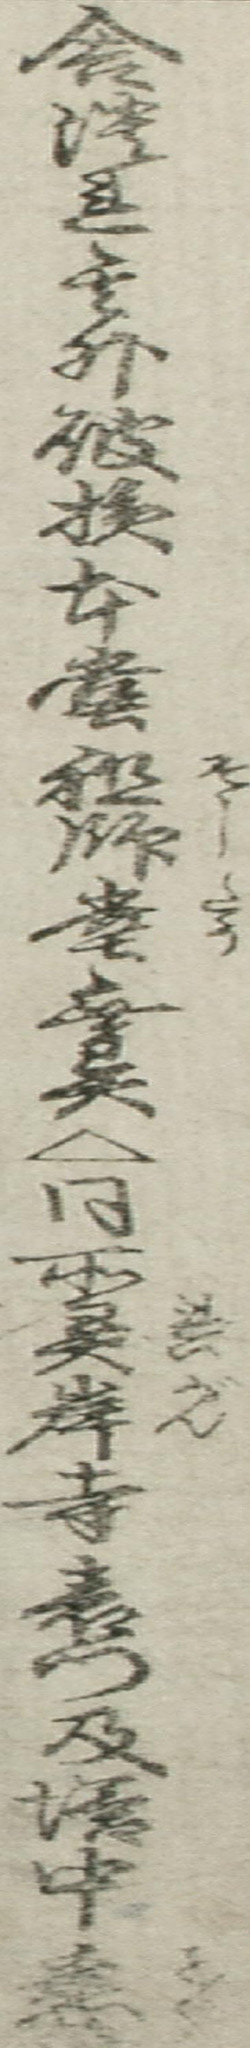舎潰れ其外破損本堂祖師堂無異△同所霊岸寺表門及塔中悉潰れ？
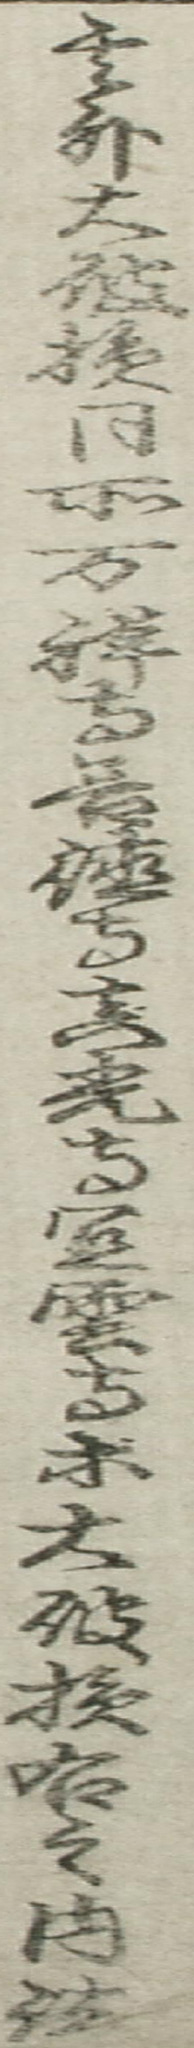其外大破損同所万禅寺善徳寺真光寺宜雲寺等大破損右之内諸
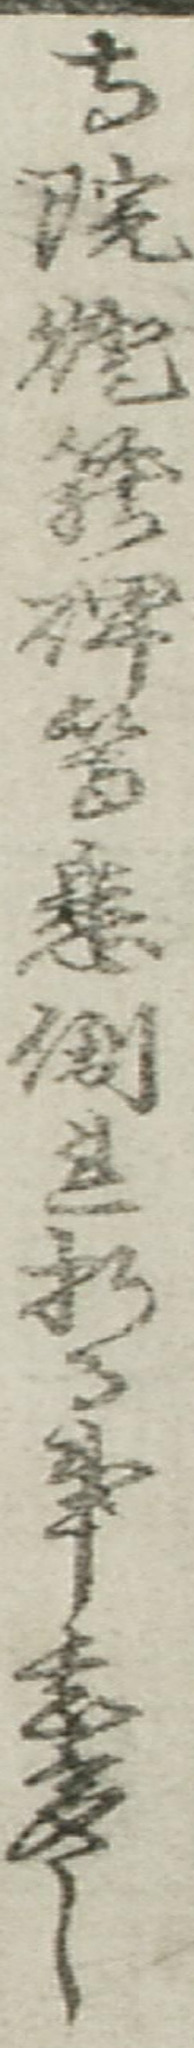寺院燈籠碑等悉倒れ折る事甚多し
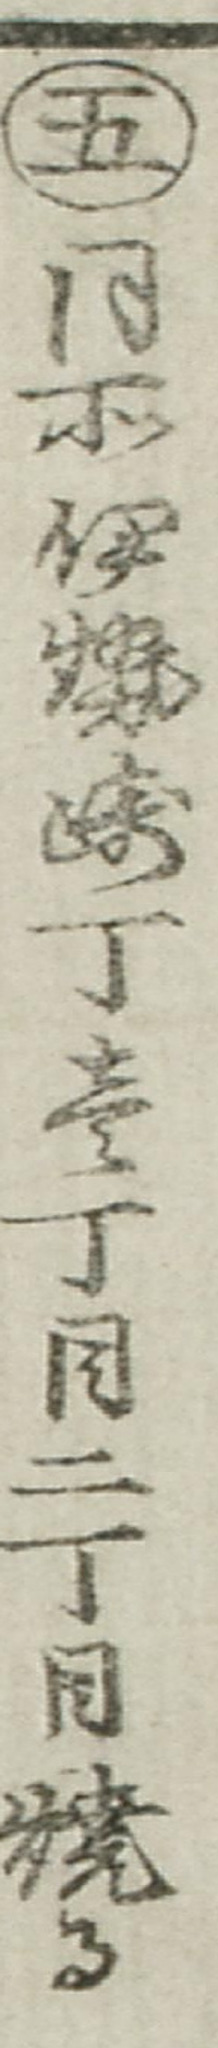同所伊勢崎丁壱丁目二丁目焼る
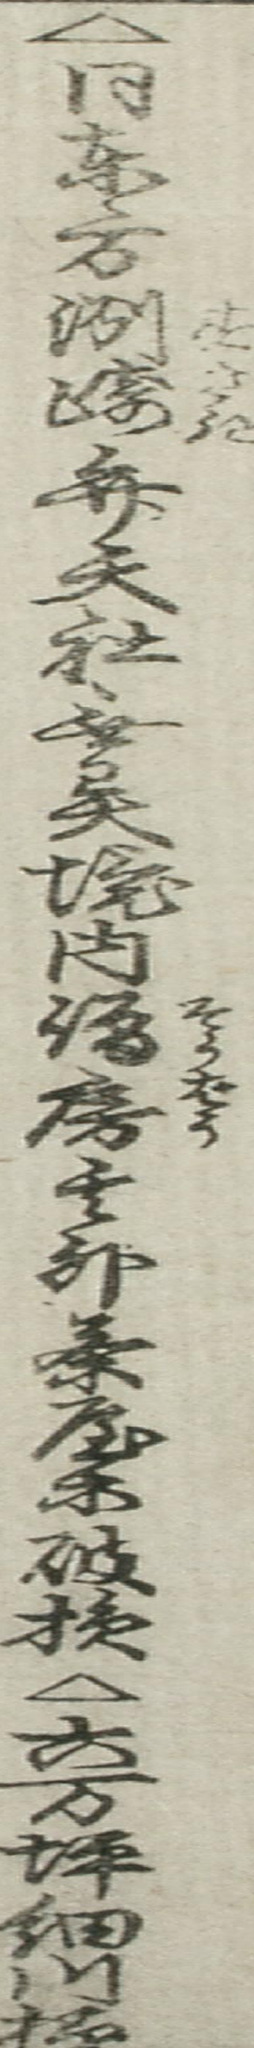△同東方洲崎弁天社無異境内僧房其外茶屋等破損△六万坪細川様
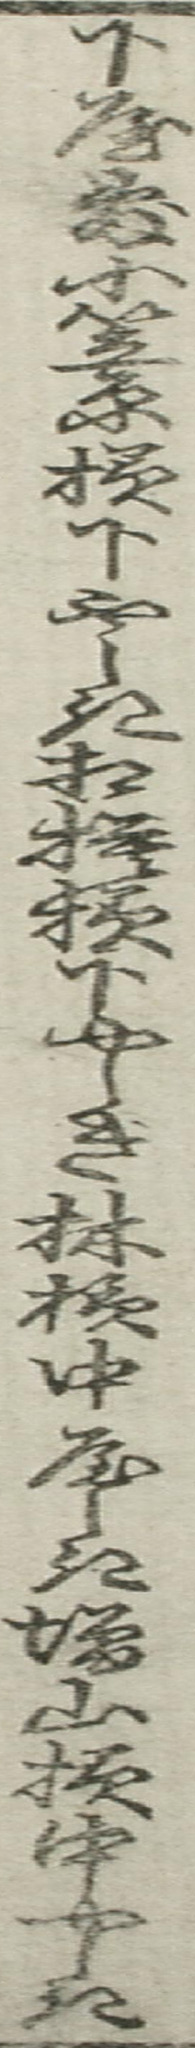下屋敷小笠原様下やしき相模様下やしき林様中屋しき増山様中やしき
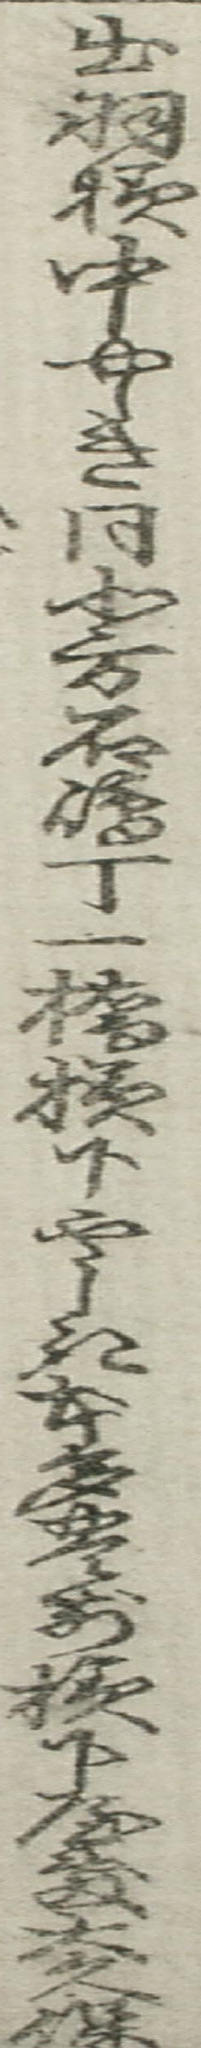出羽様中やしき同北方石嶋丁一橋様下やしき本多豊前様下屋敷大久保
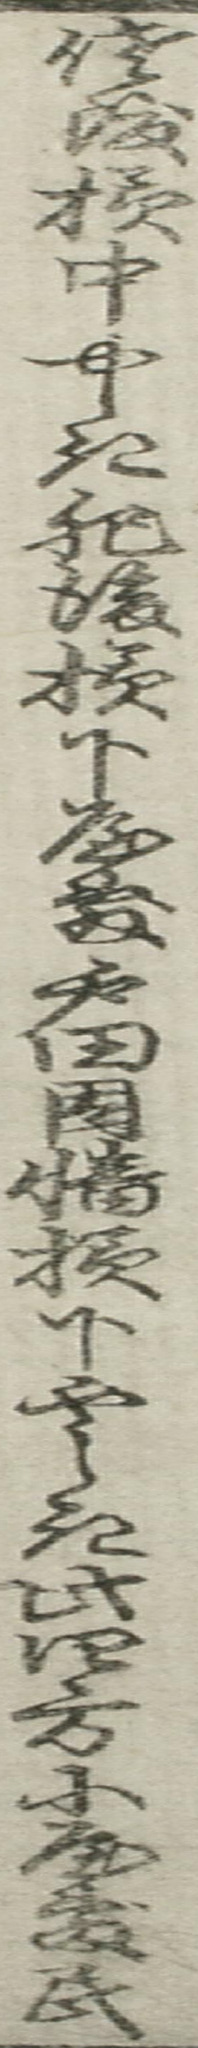佐藤様中やしき肥後様下屋敷戸田因幡様下やしき此四方に屋敷民
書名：安政見聞誌　上
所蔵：東京大学地震研究所図書室 Earthquake Research Institute Library, The University of Tokyo, JAPAN
